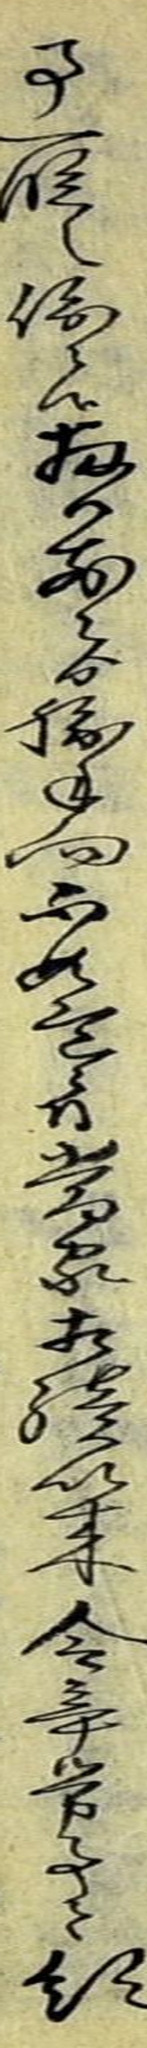事一段之儀ニ候扨ハ前々ゟ勝手向不如意ニ付当家相続以来令辛労事ニ候領
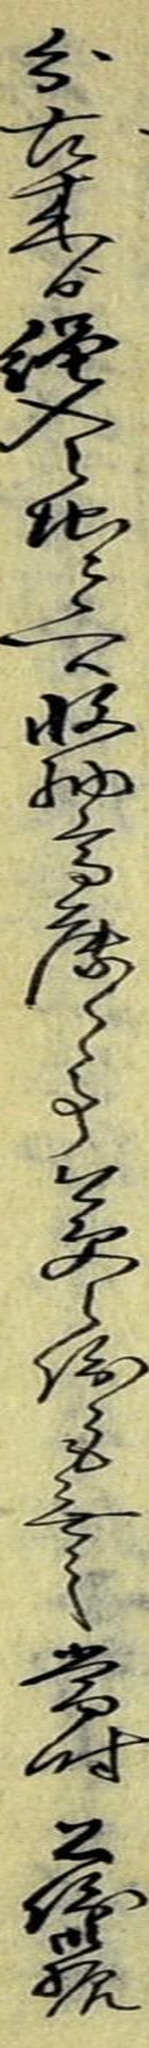分古来ゟ縄入之地ニ候ヘハ収納高薄く候事今更之儀ニも無之当時公儀御振
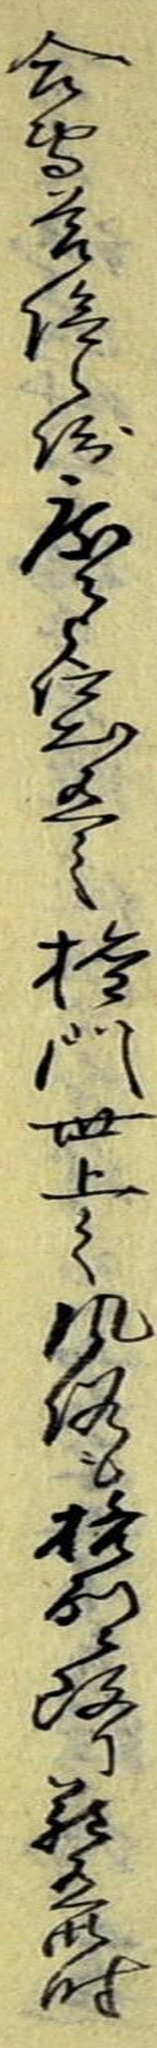合専節倹之儀度々被仰出有之権門世上之風俗も格別ニ改り難有御時

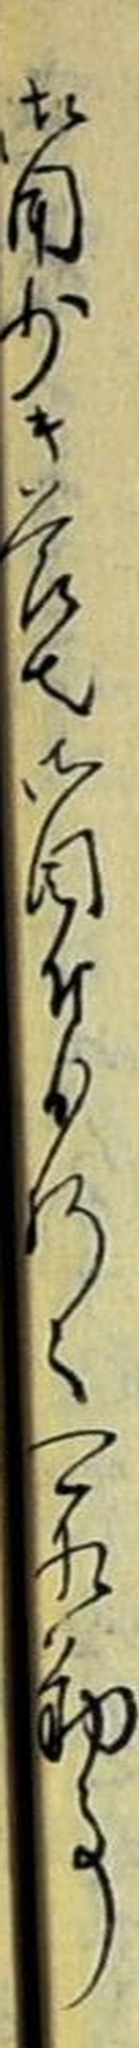御用少キ節者御目付ゟ折々可相勤事
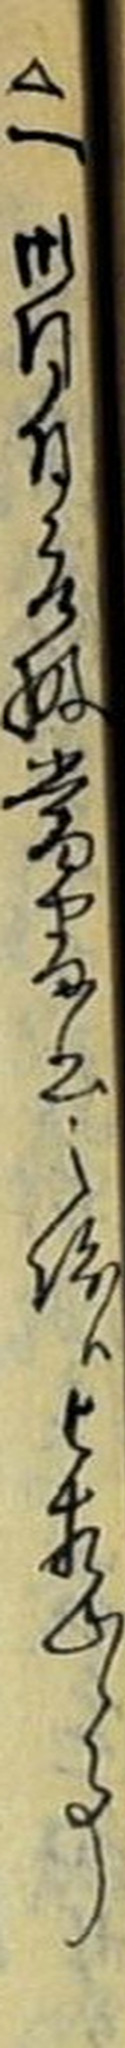△一御目付取扱当番書之儀ハ被相止候事

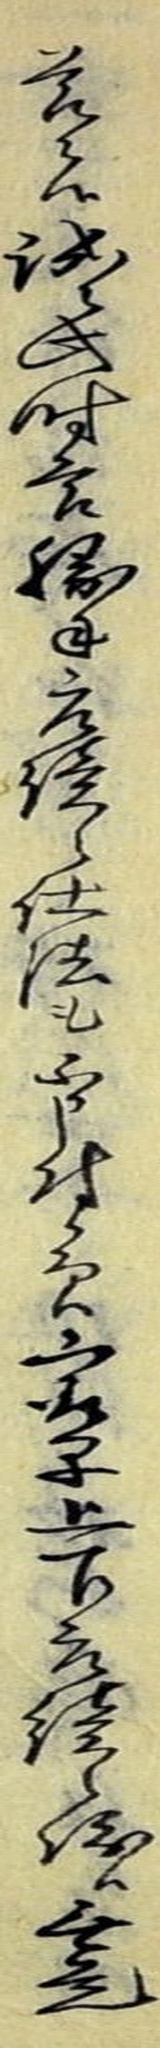節ニ候誠ニ此時節勝手取続之仕法も不申付候而ハ最早上下取続之儀ハ無覚
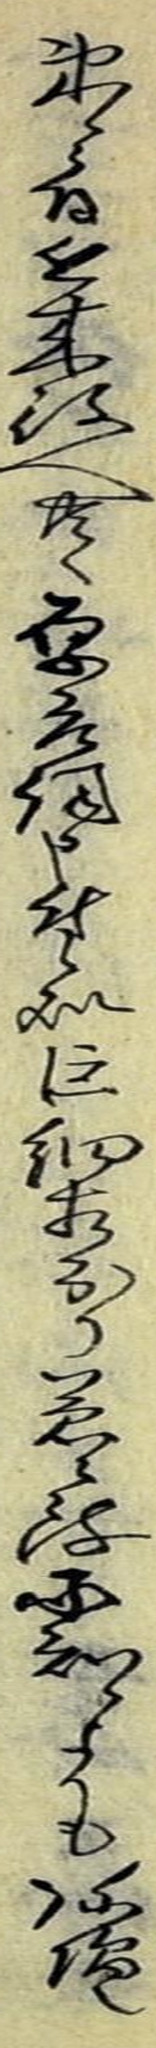束候ニ付近来役人共へ厚取調申付候処巨細相分り兼々致承知候よりも弥増之
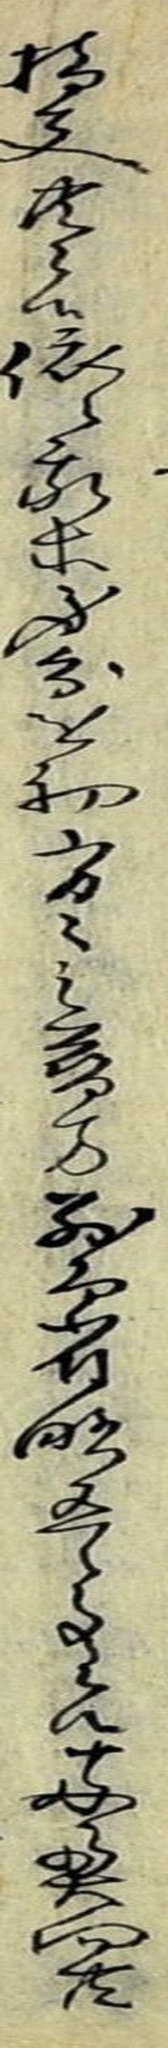指支共ニ候依之我等身分を初方々之暮方別而省略有之事ニ候両奥向共
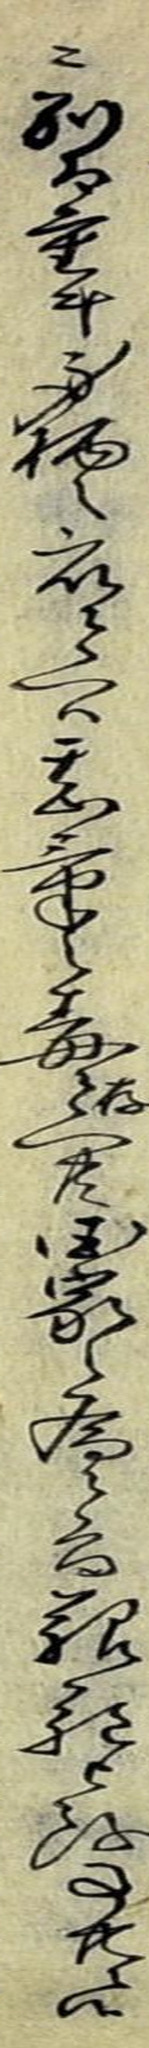ニ別而重キ身柄之衆ニ候ヘハ甚気之毒ニ存候へ共国家之為ニ候間艱難被致事共ニ候
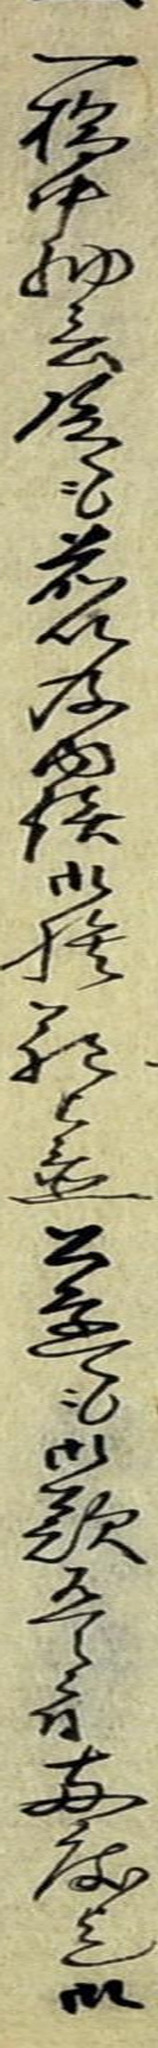一一橋中納言殿へも前以及内談御捨難被置公辺へも御歎有之ニ付両度迄御
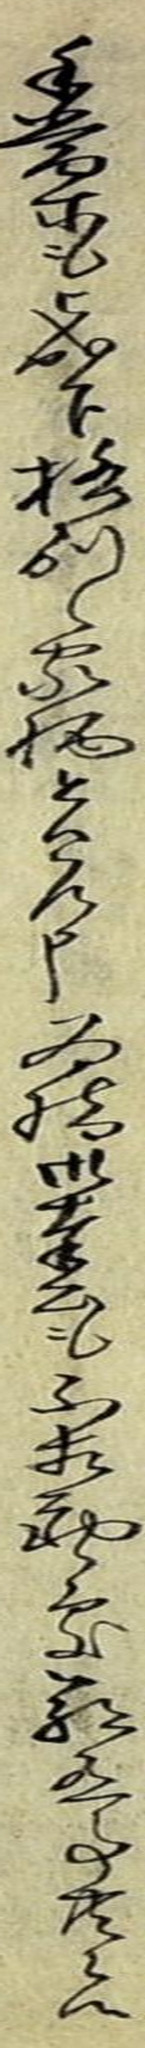手当等も被成下格別之家柄とハ乍申為指御奉公も不相勤候処難有事共ニ候
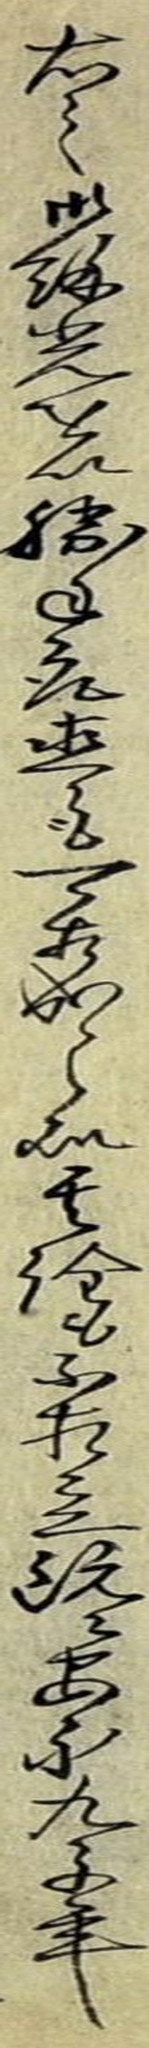右之御余光を以勝手取直とも可相成候処其詮も不相立既ニ安永九子年
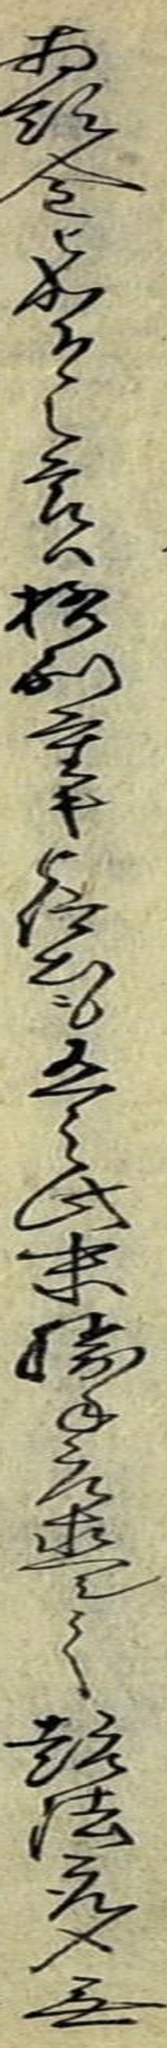拝領金被成下候之節ハ格別重キ被仰出も有之此末勝手取直シ之趣法取〆無
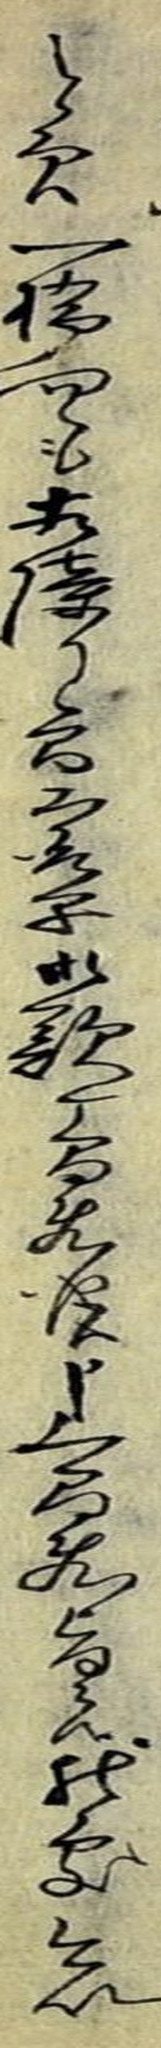之候而ハ一橋向へも相障り候間最早御歎ケ間敷儀ハ申上間敷旨ニ候然処今以
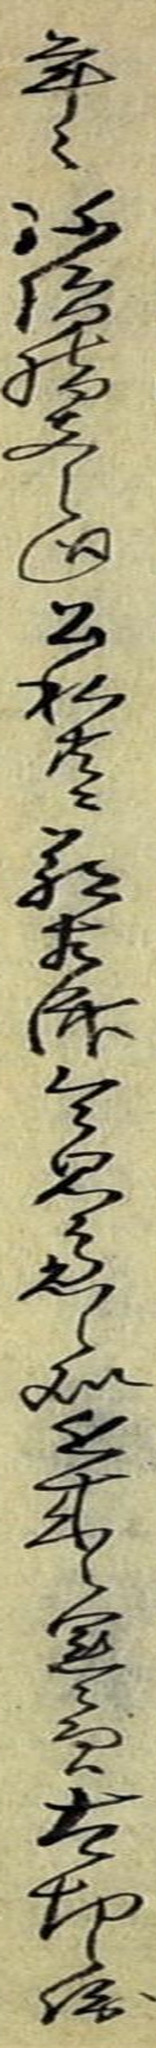年々弥増指支之趣公私共ニ難相済令思慮候処近来之運ニ而ハ太切之儀
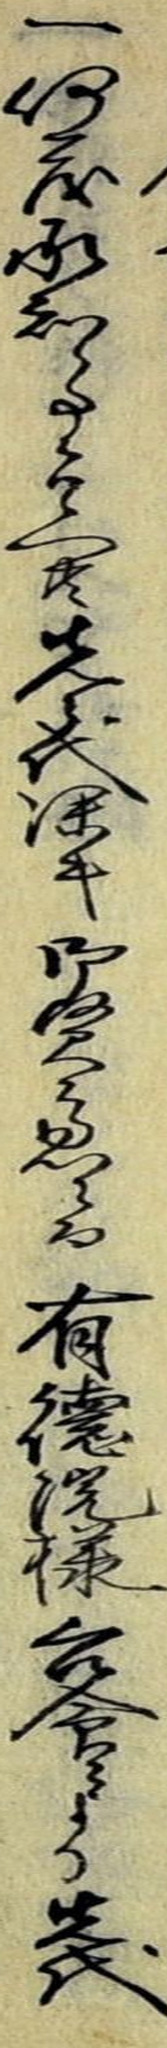一何茂承知之事ニハ候へ共先々代深キ御賢慮ニ而有徳院様台命ニより先代
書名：命令之部 三
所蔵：福井県文書館 Fukui Prefectural Archives
